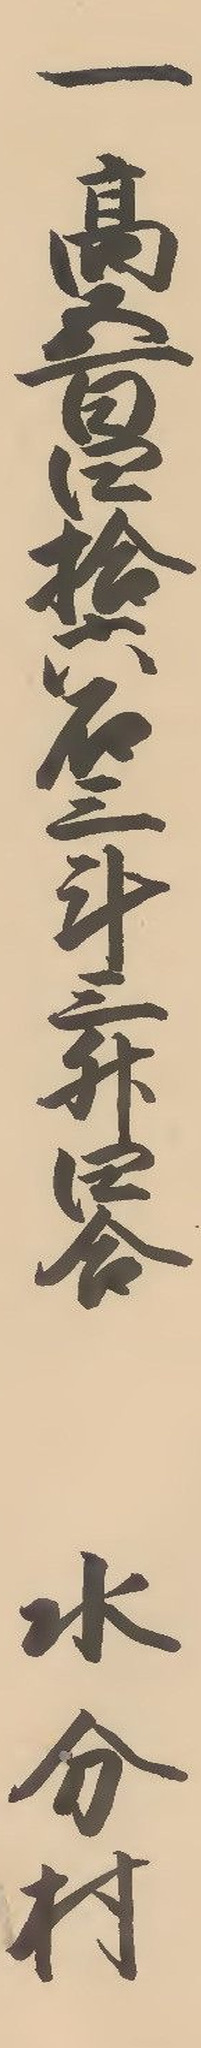一高五百四拾六石三斗三升四合水分村
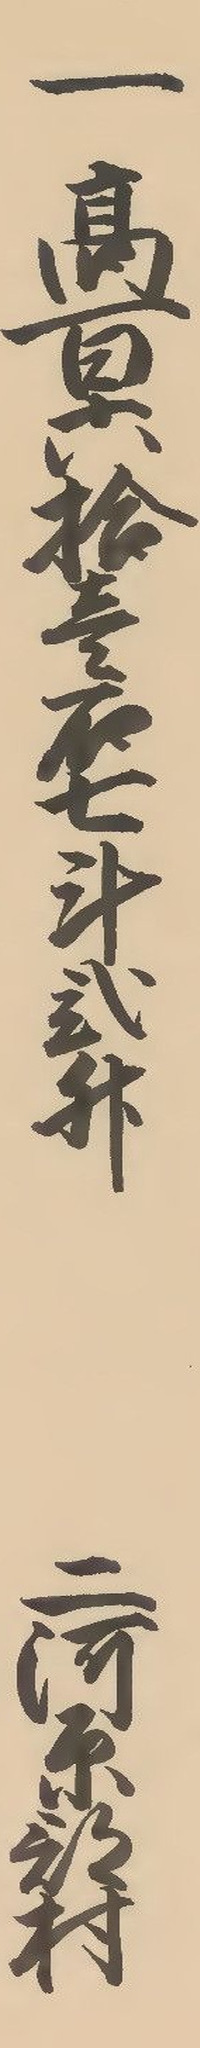一高百六拾壱石七斗弐升二河原部村
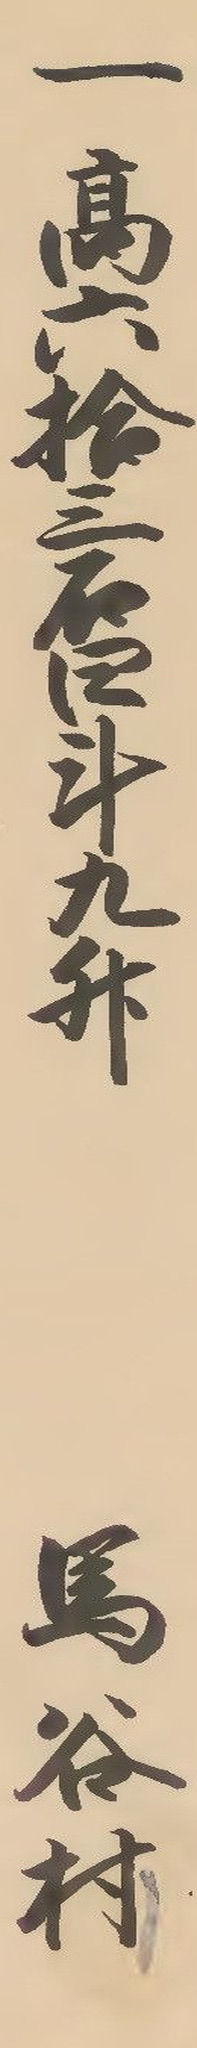一高六拾三石四斗九升馬谷村
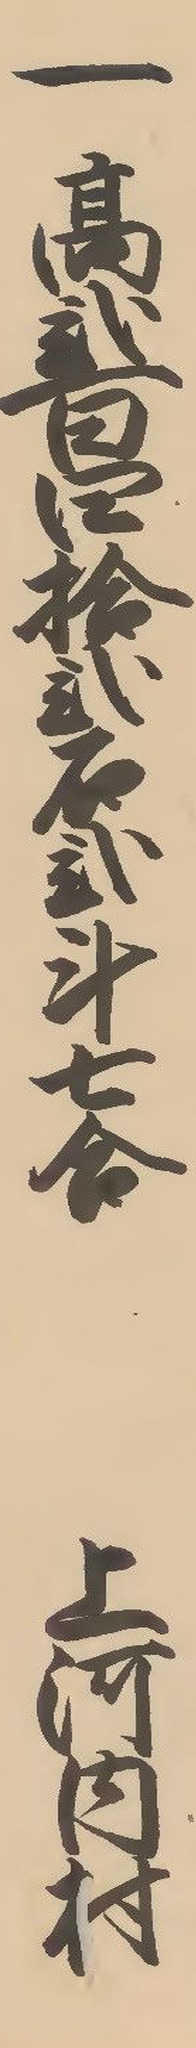一高弐百四拾弐石弐斗七合上河内村
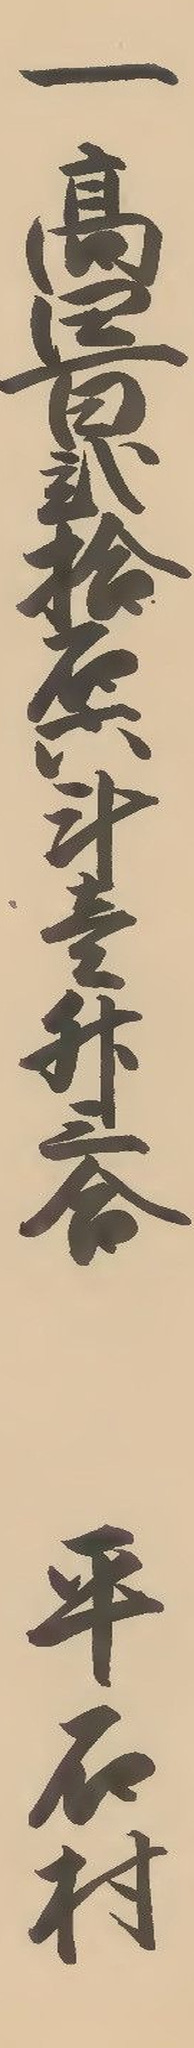一高四百弐拾石六斗壱升三合平石村
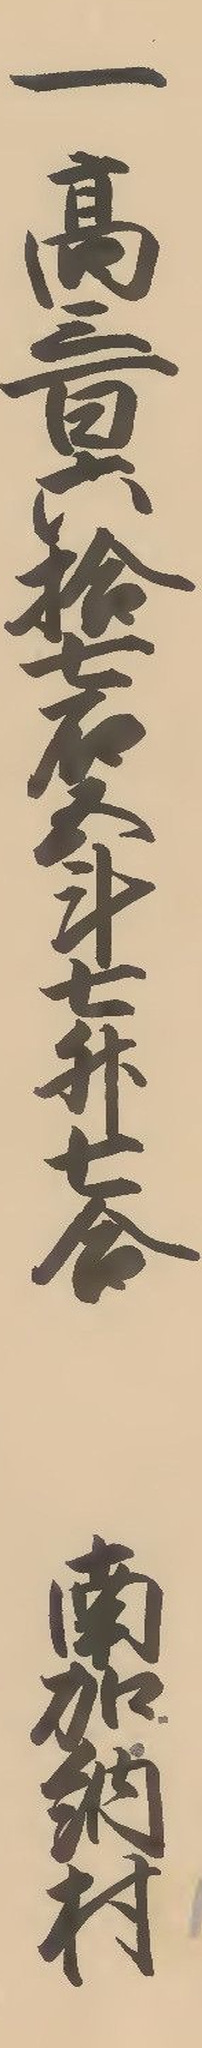一高三百六拾七石五斗七升七合南加納村
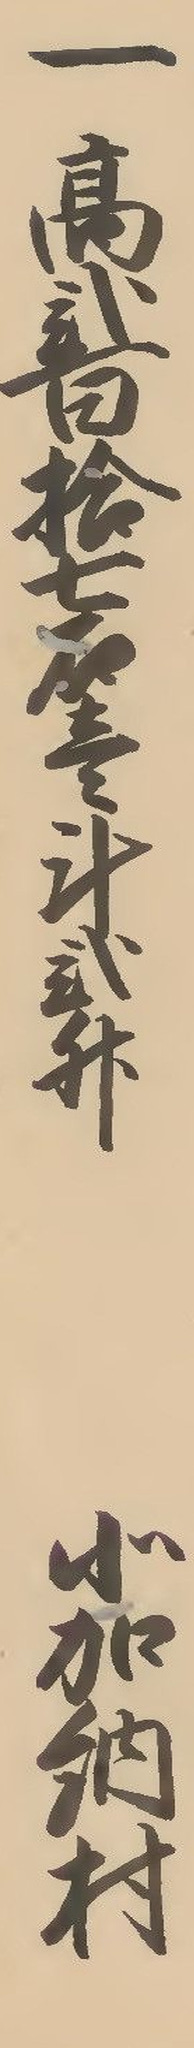一高弐百拾七石壱斗弐升北加納村

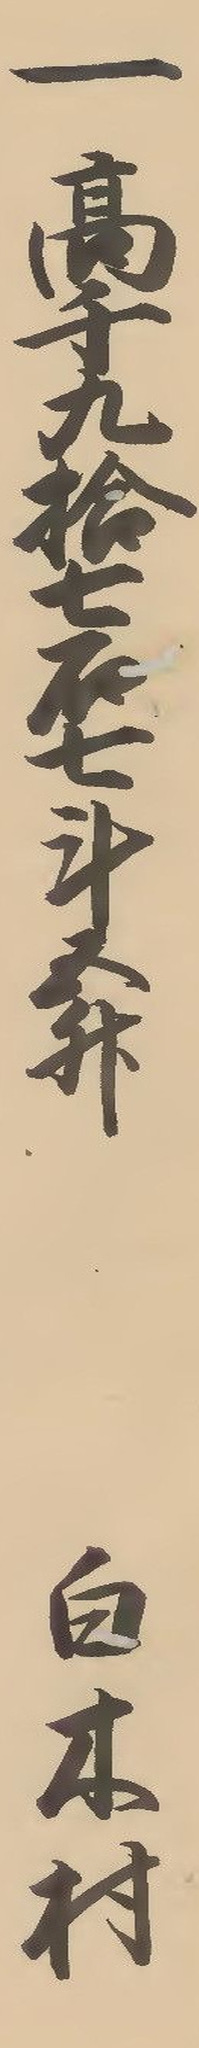一高千九拾七石七斗五升白木村
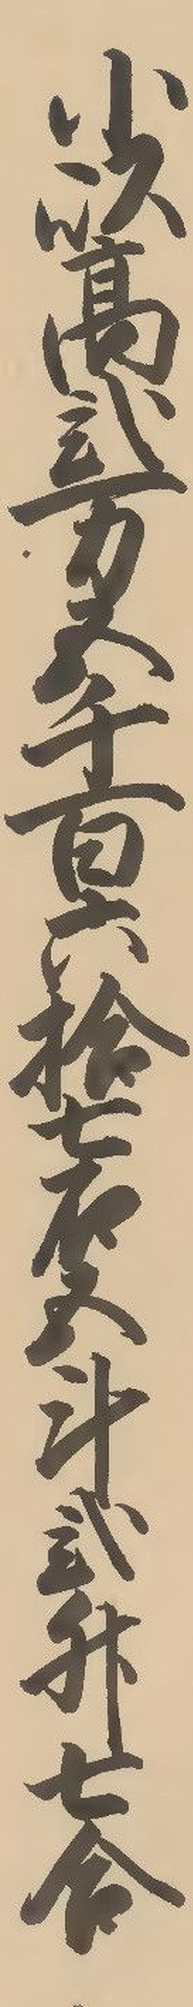小以高弐万五千百六拾七石五斗弐升七合
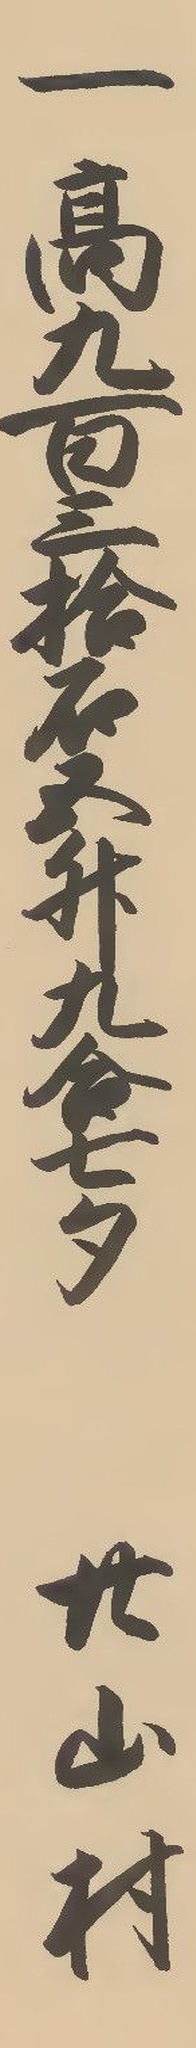一高九百三拾石五升九合七勺廿山村

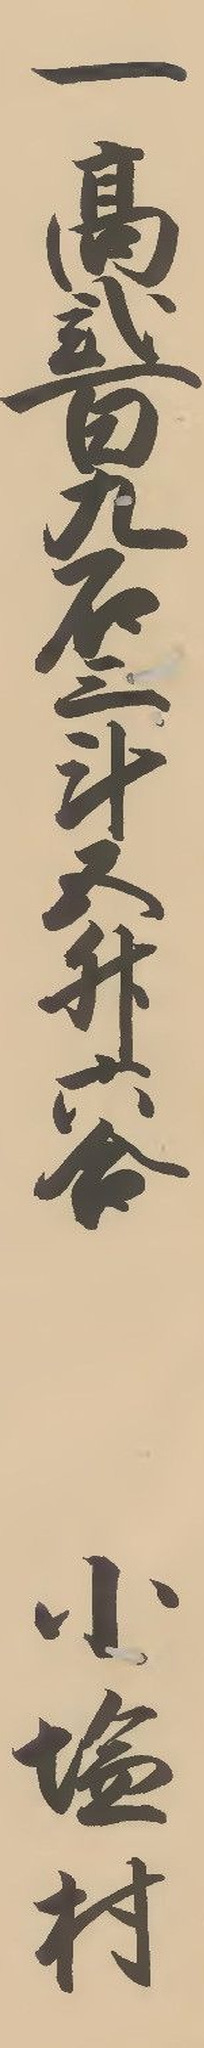一高弐百九石三斗五升六合小塩村
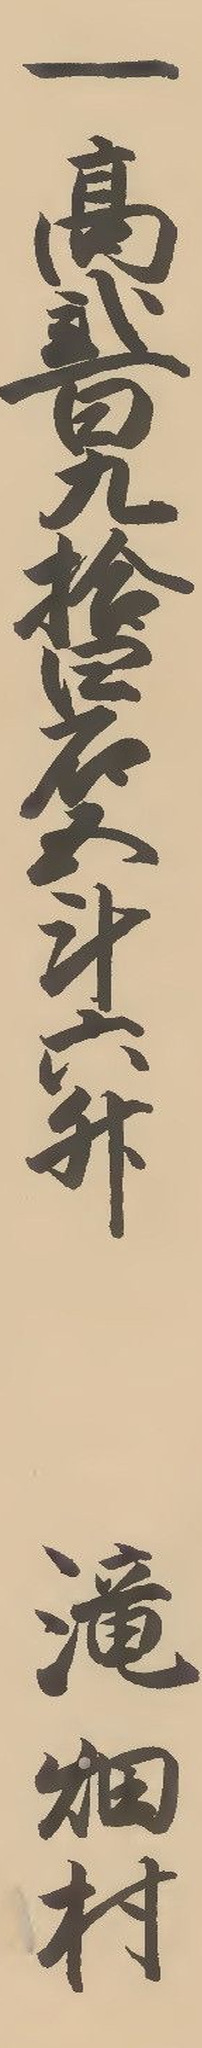一高弐百九拾四石五斗六升滝畑村
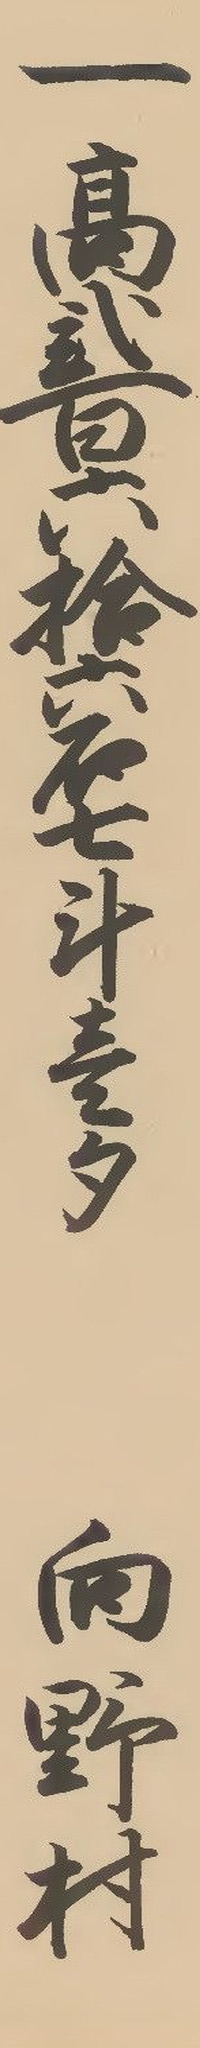一高弐百六拾六石七斗壱勺向野村
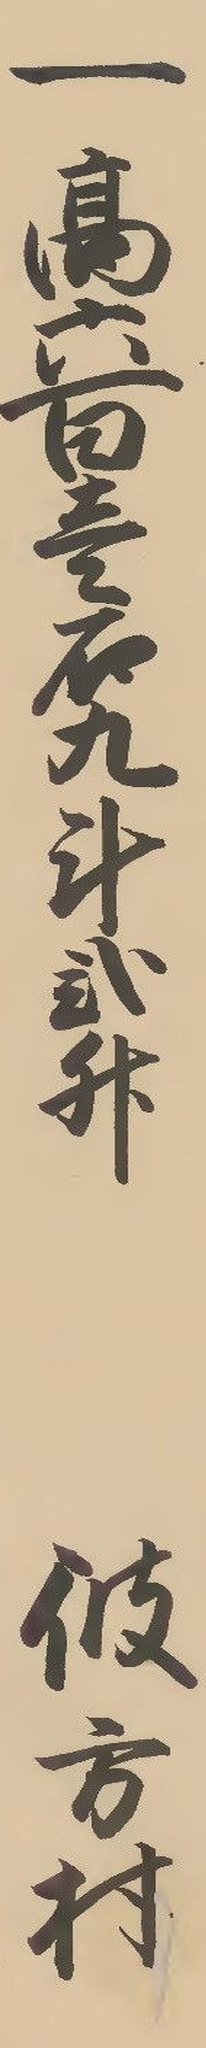一高六百壱石九斗弐升彼方村
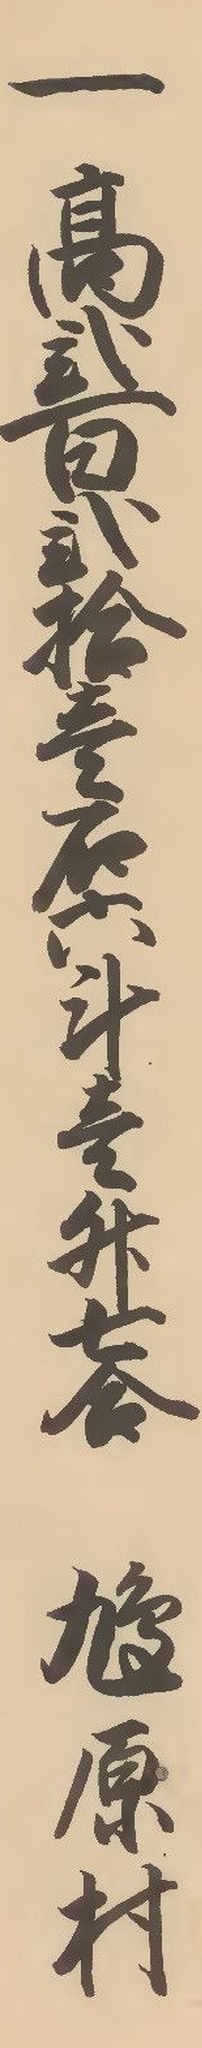一高弐百弐拾壱石六斗壱升七合鳩原村
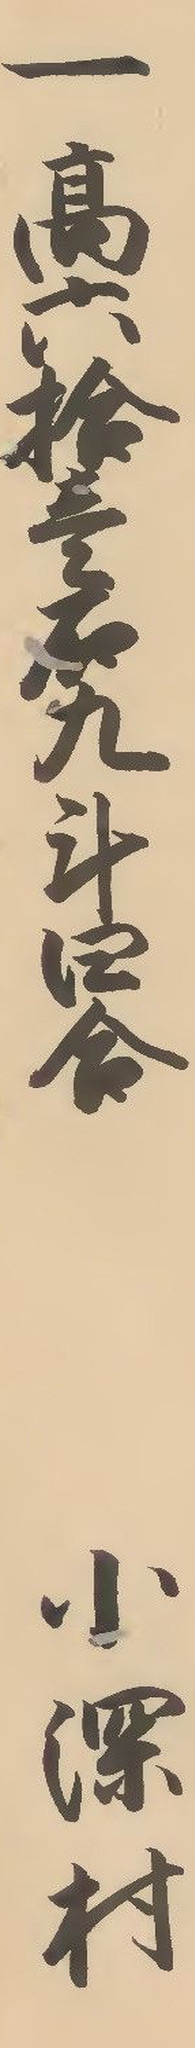一高六拾壱石九斗四合小深村
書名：河内国郷帳
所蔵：国立公文書館 National Archives of Japan
